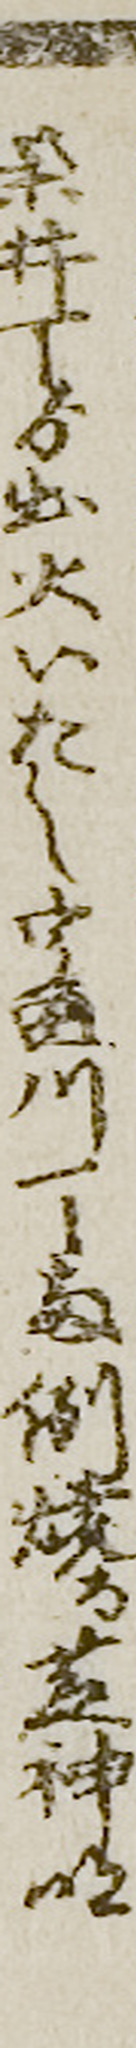柴井丁より出火いたし宇田川丁両側焼る芝神明
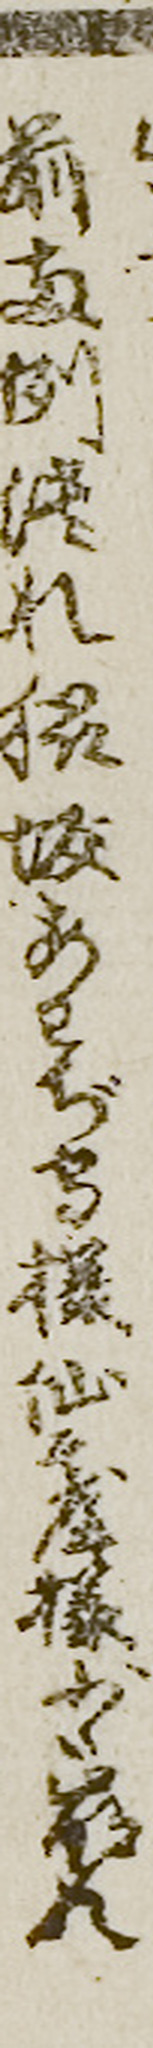前両側潰れ脇坂あわぢ守様仙台様少々崩れ
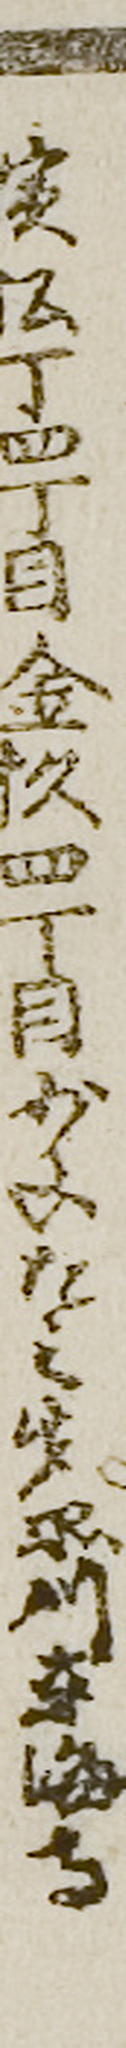浜松町四丁目金杉四丁目少々いたみ品川東海寺
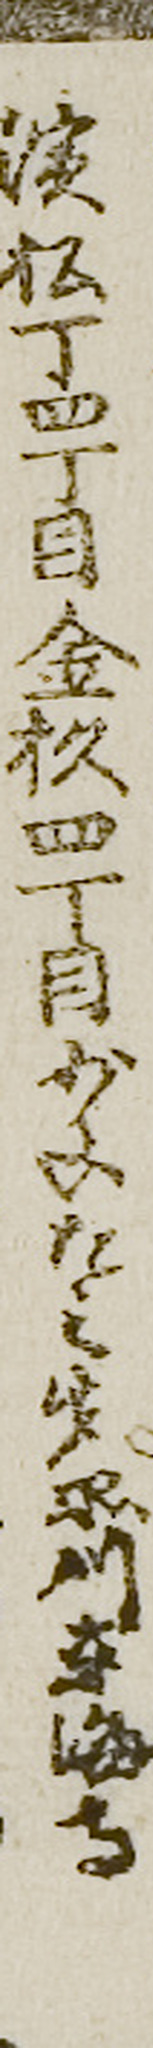浜松町四丁目金杉四丁目少々いたみ品川東海寺
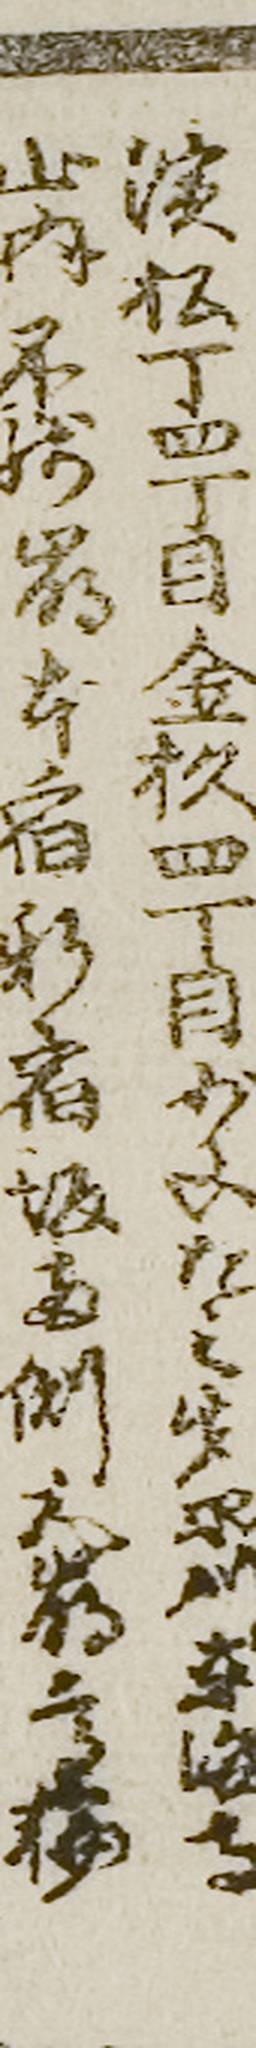山内不残崩本宿新宿坂両側大崩高輪
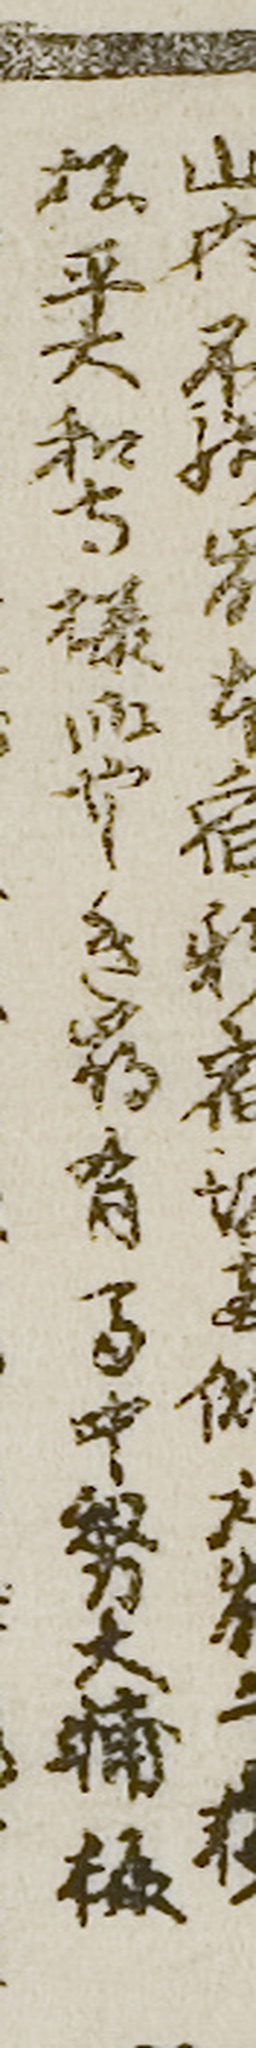松平大和守様御やしき崩有馬中務大輔様
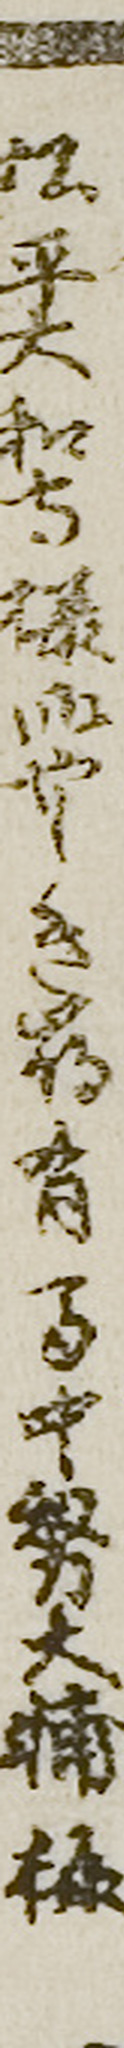松平大和守様御やしき崩有馬中務大輔様
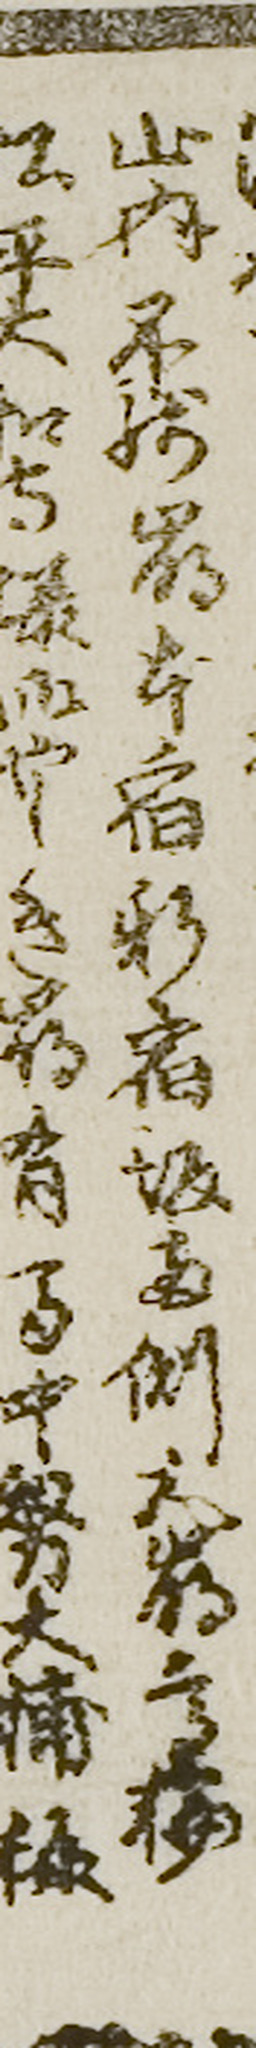松平大和守様御やしき崩有馬中務大輔様
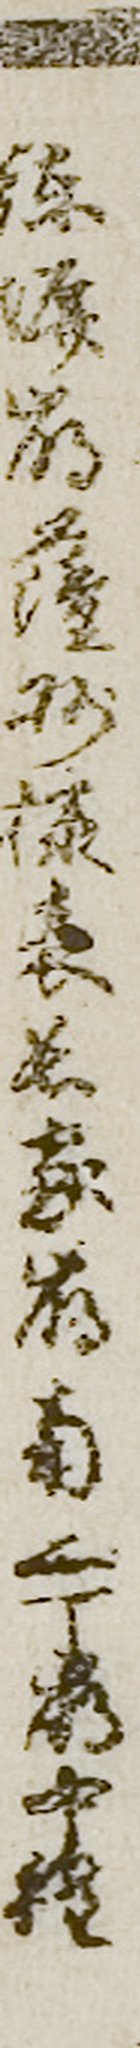練塀崩薩摩様表長屋崩南二丁崩中程
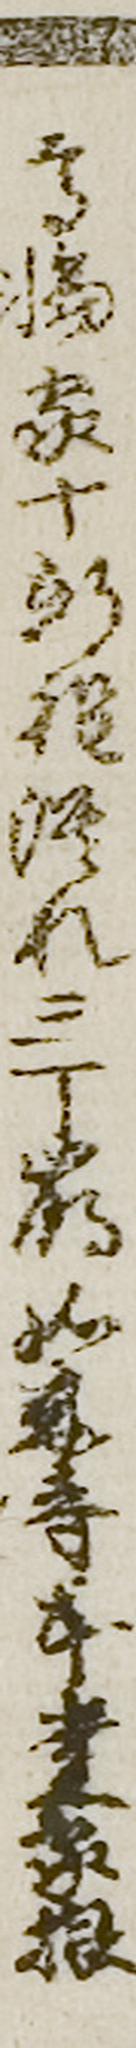高輪家十軒ほど潰れ三丁崩如来寺本堂家根
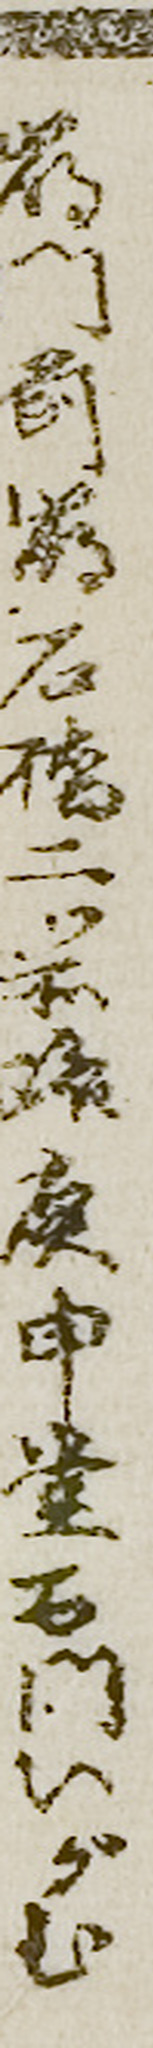崩門前崩石橋二ツ所路庚申堂石門いがむ
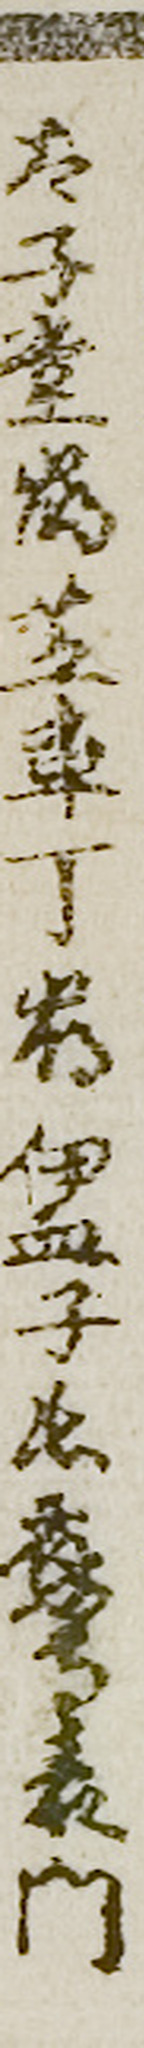太子堂崩芝車丁崩伊皿子長応守表門
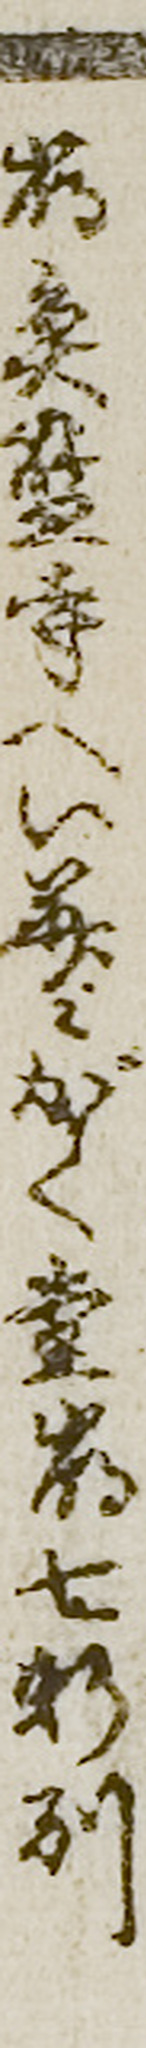崩魚籃寺へい并にがく堂崩七軒別
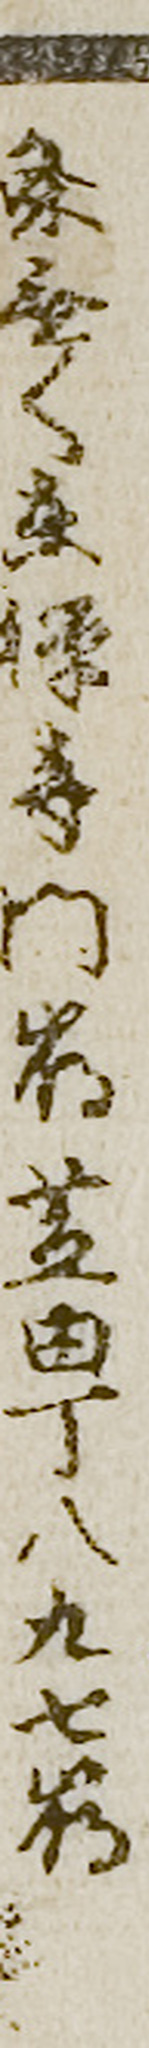条無く東禅寺門崩芝田丁八九七崩
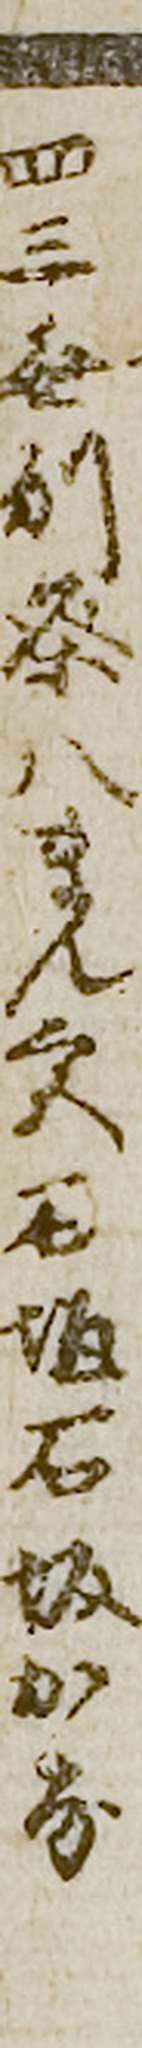四三無別条八まん宮石垣石坂かな
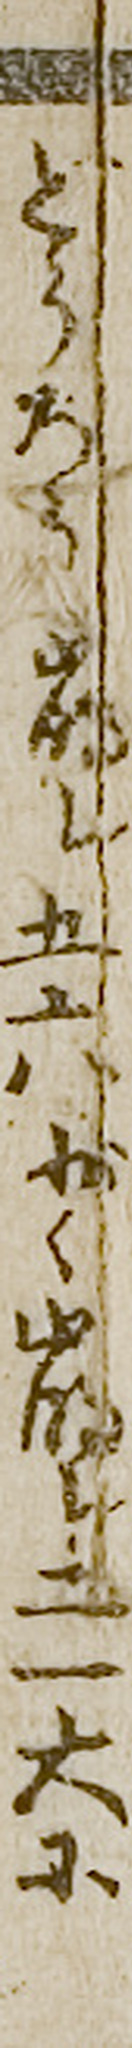どうろう崩れ五六少々崩れ二一大に
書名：江戸大地震出火場所附
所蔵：東京大学総合図書館 General Library in the University of Tokyo, JAPAN
